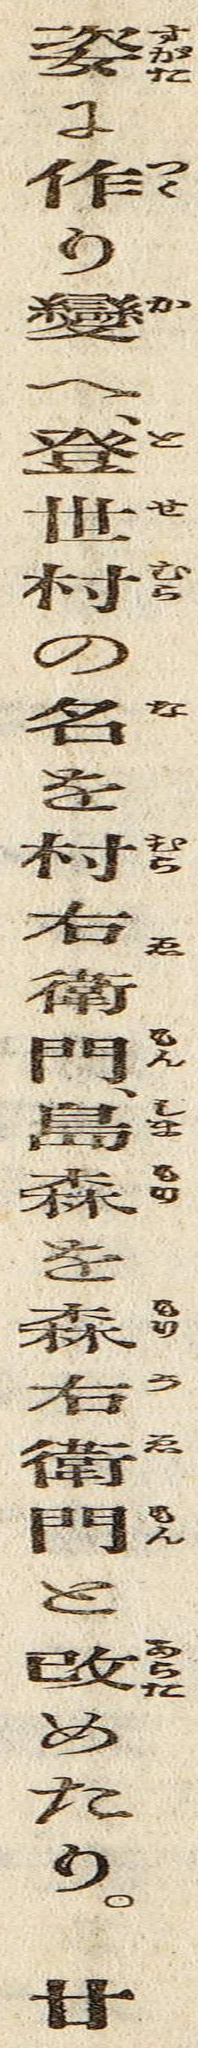姿に作り変へ、登世村の名を村右衛門、島森を森右衛門と改めたり。廿
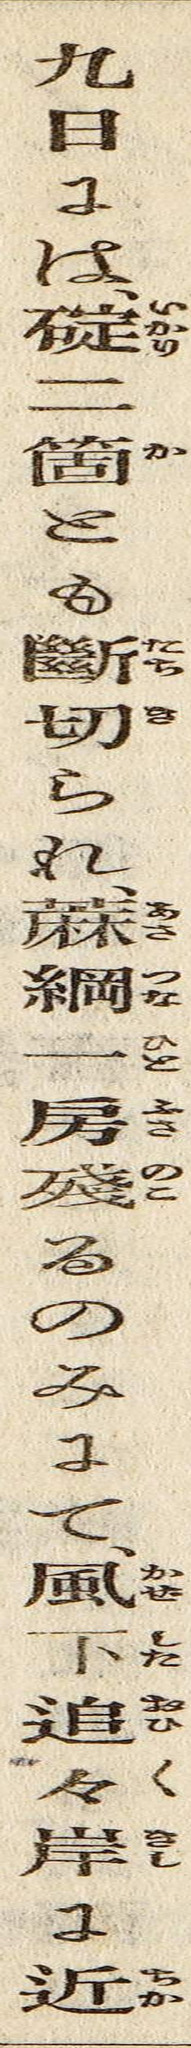九日には、碇二箇とも断切られ、麻綱一房残るのみにて、風下追々岸に近
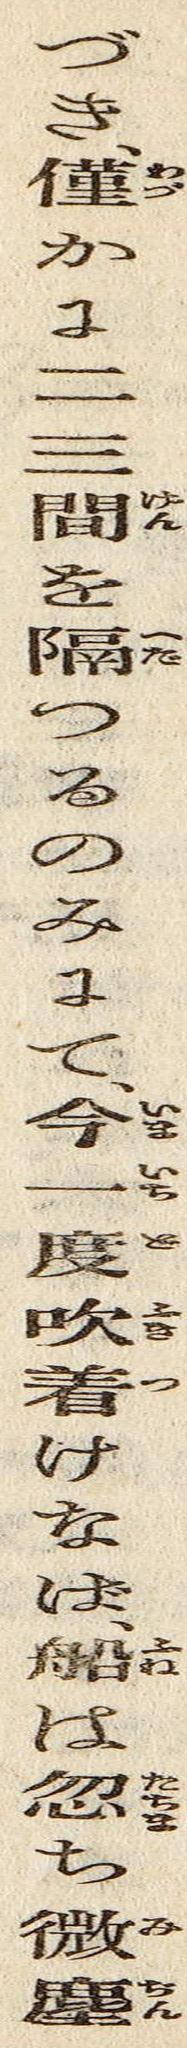づき、僅かに二三間を隔つるのみにて、今一度吹着けなば、船は忽ち微塵
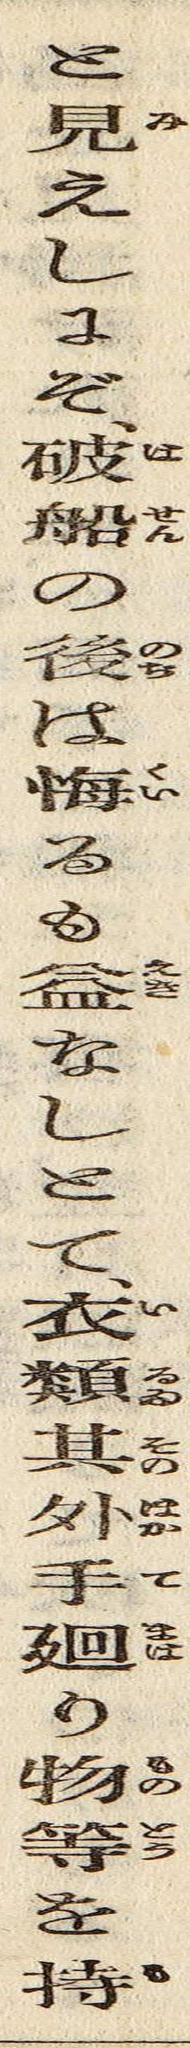と見えしにぞ、破船の後は悔るも益なしとて、衣類其外手廻り物等を持
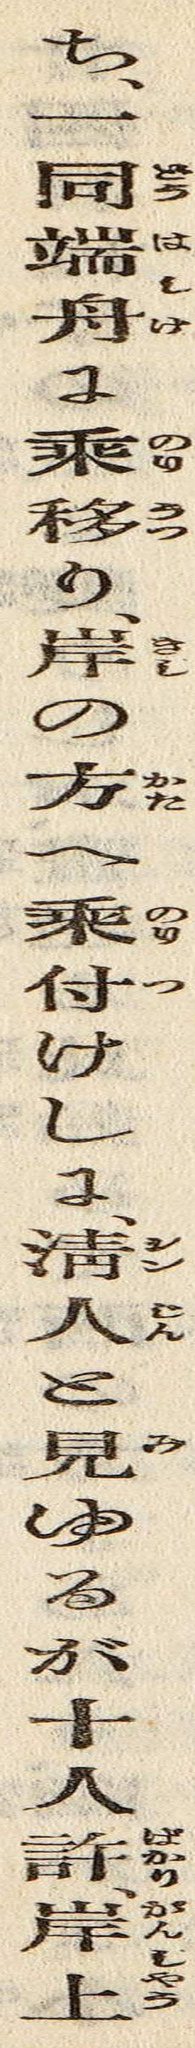ち、一同端舟に乗移り、岸の方へ乗付けしに、清人と見ゆるが十人許、岸上
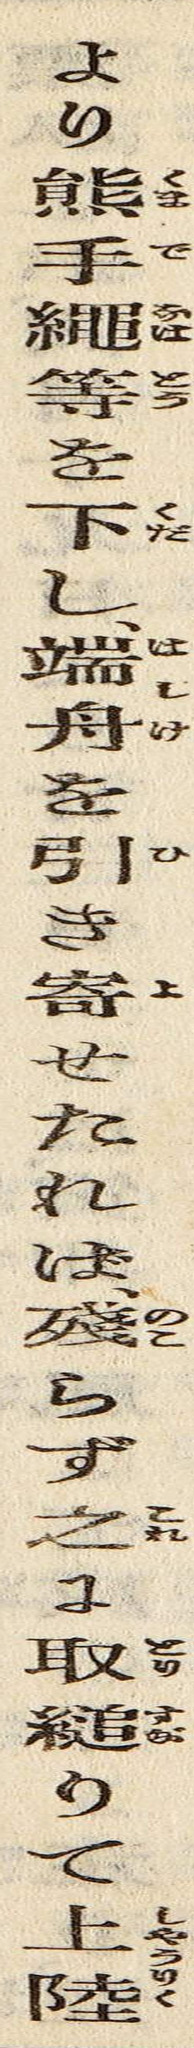より熊手縄等を下し、端舟を引き寄せたれば、残らず之に取縋りて上陸
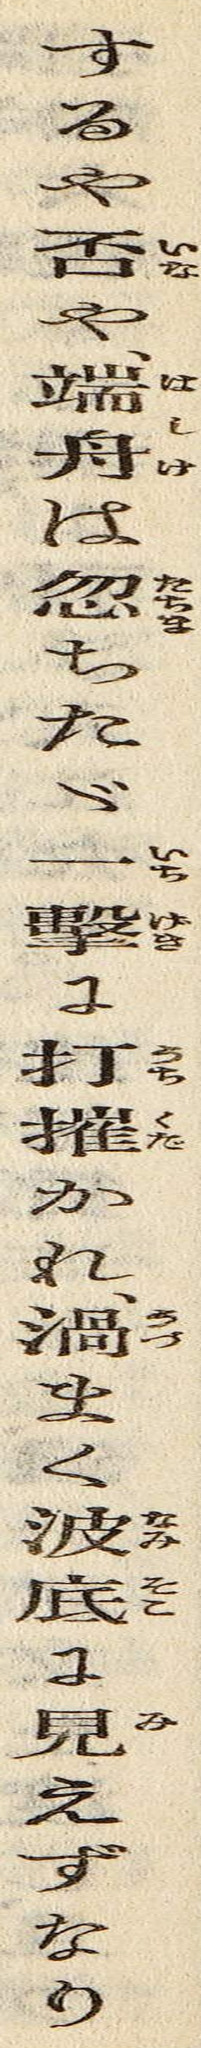するや否や、端舟は忽ちたゞ一撃に打摧かれ、渦まく波底に見えずなり
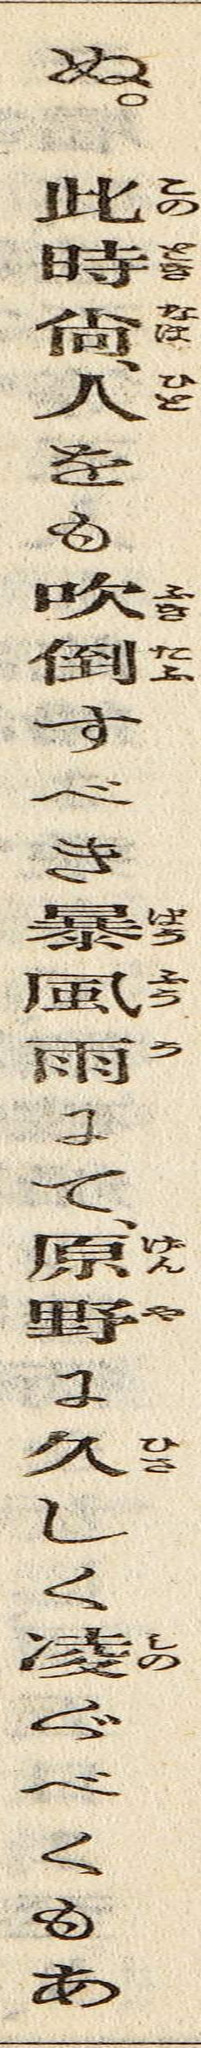ぬ。此時尚、人をも吹倒すべき暴風雨にて、原野に久しく凌ぐべくもあ
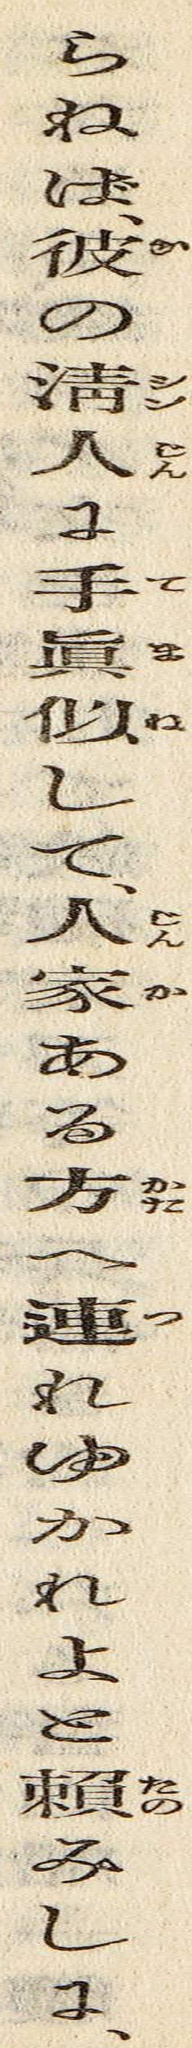らねば、彼の清人に手真似して、人家ある方へ連れゆかれよと頼みしに、
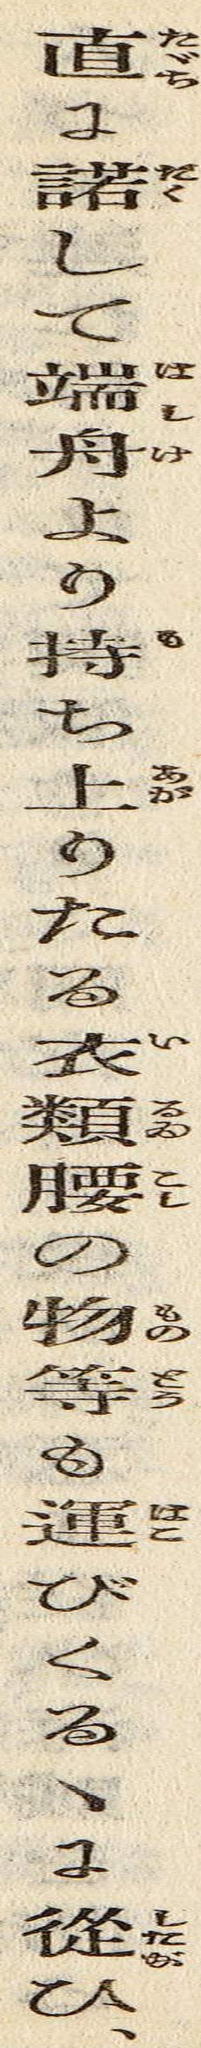直に諾して端舟より持ち上りたる衣類腰の物等も運びくるヽに従ひ、
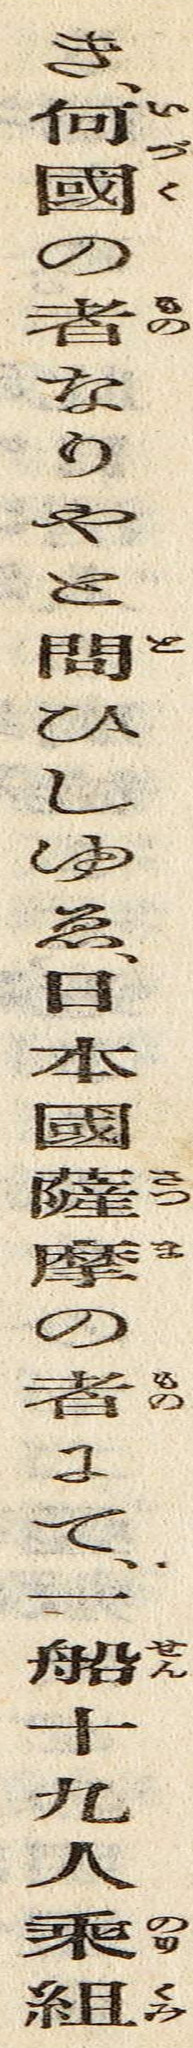き、何国の者なりやと問ひしゆゑ、日本国薩摩の者にて、一船十九人乗組
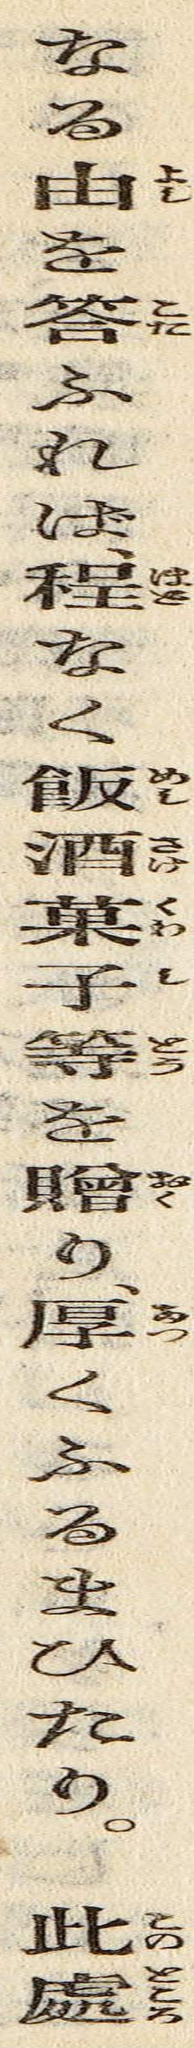なる由を答ふれば、程なく飯酒菓子等を贈り、厚くふるまひたり。此処
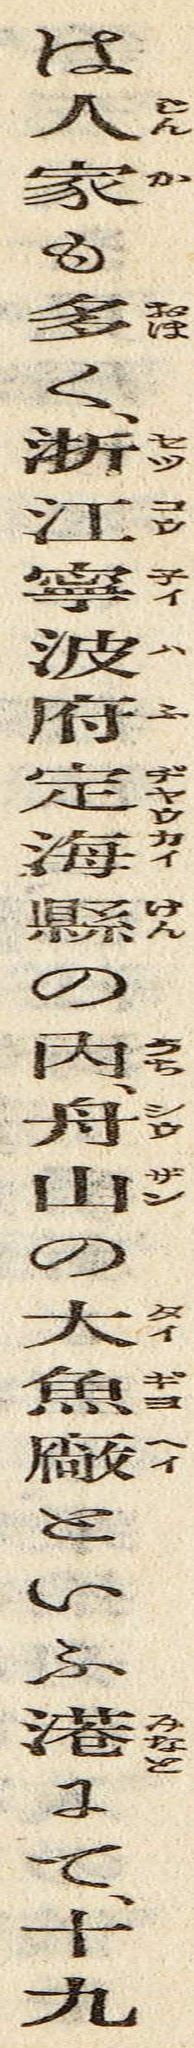は人家も多く、浙江寧波府定海県の内、舟山の大魚廠といふ港にて、十九
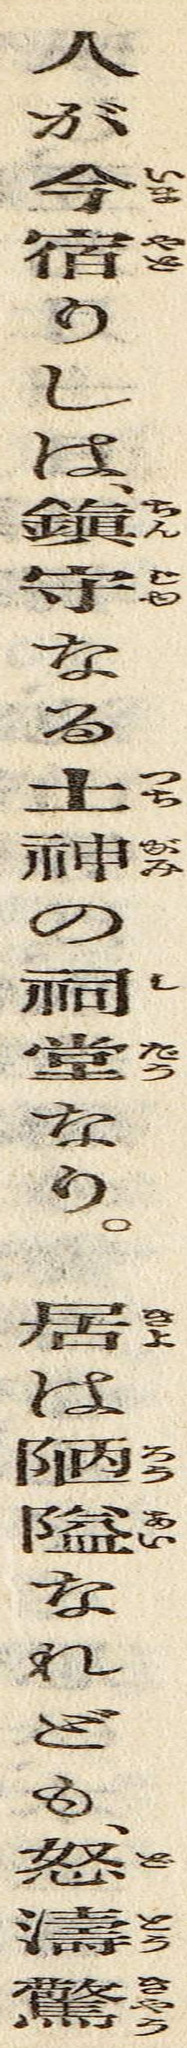人が今宿りしは、鎮守なる土神の祠堂なり。居は陋隘なれども、怒濤驚
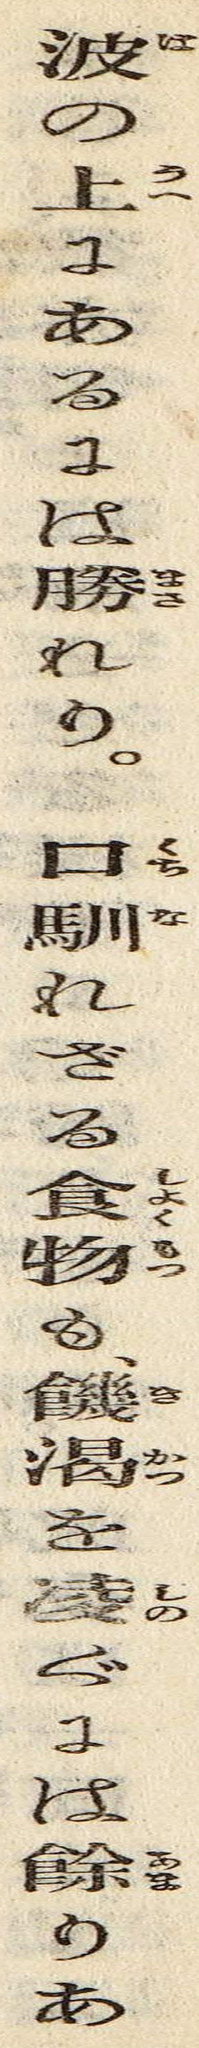波の上にあるには勝れり。口馴れざる食物も、饑渇を凌ぐには余りあ
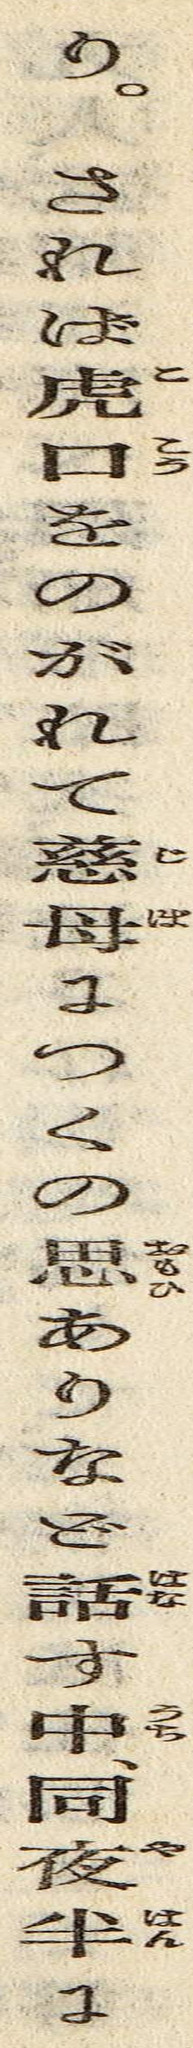り。されば虎口をのがれて慈母につくの思ありなど話す中、同夜半に
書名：日本漂流譚
